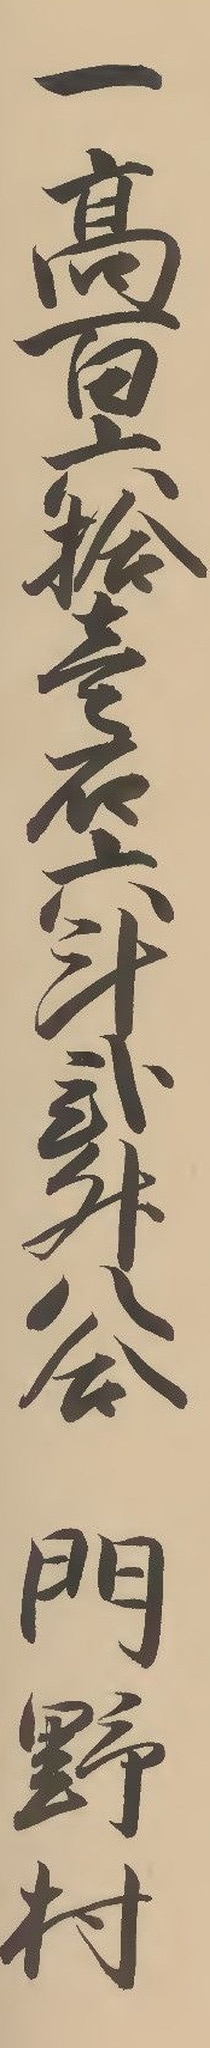一高百六拾壱石六斗弐升八合門野村
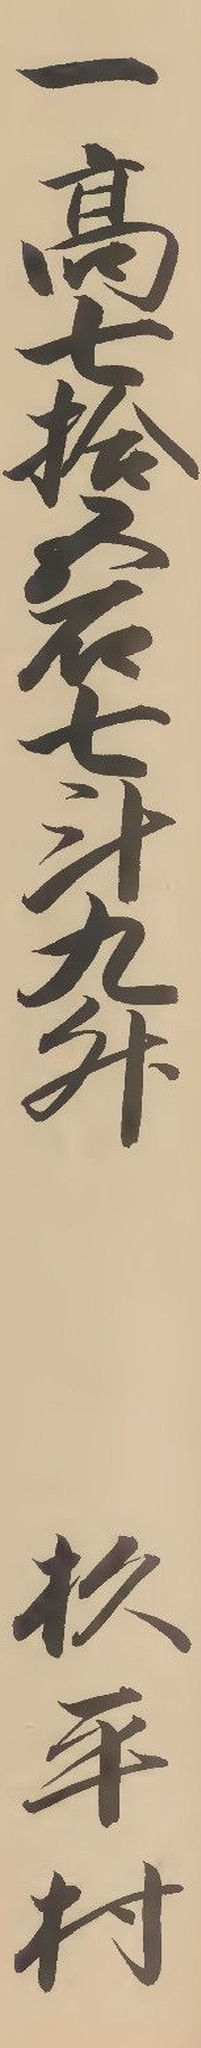一高七拾五石七斗九升杉平村
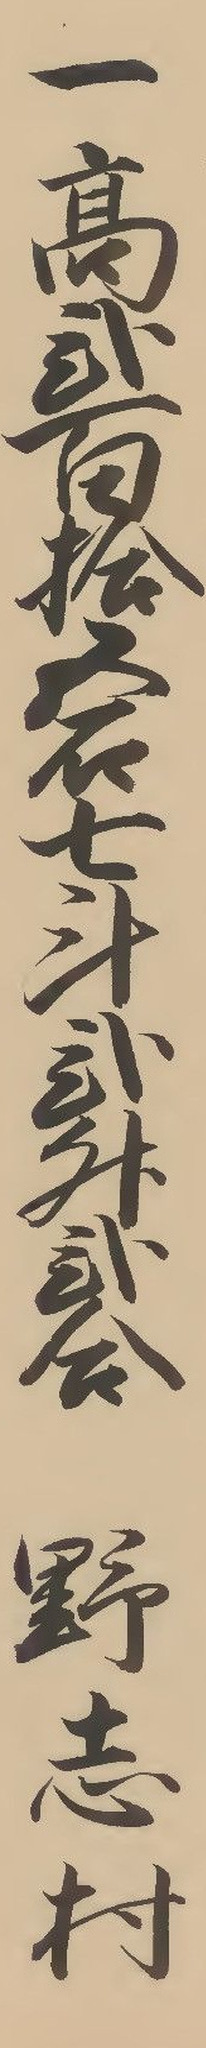一高弐百拾五石七斗弐升弐合野志村
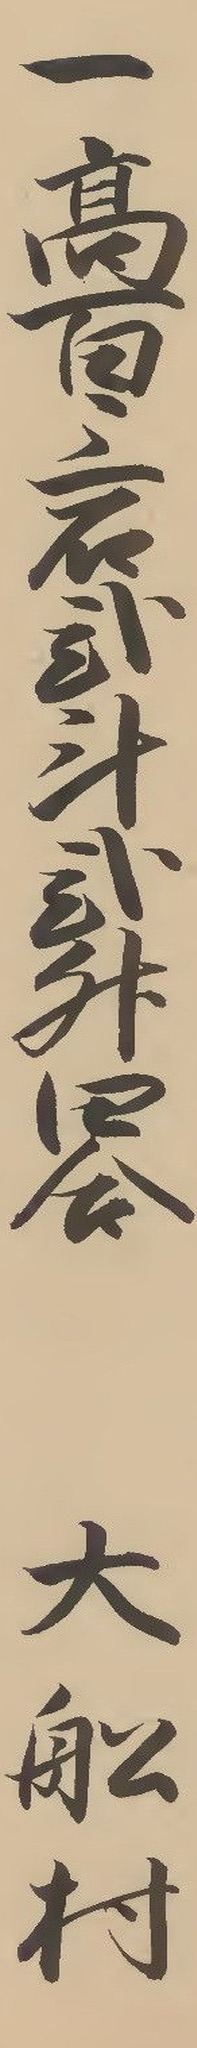一高百三石弐斗弐升四合大船村
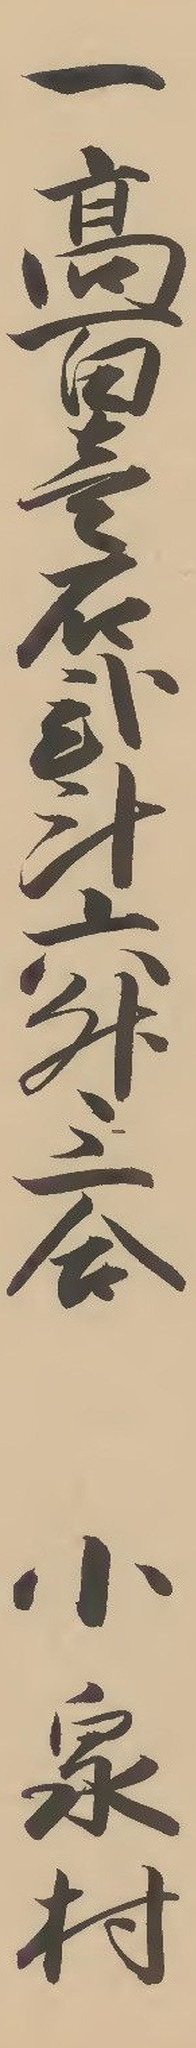一高百壱石弐斗六升三合小泉村

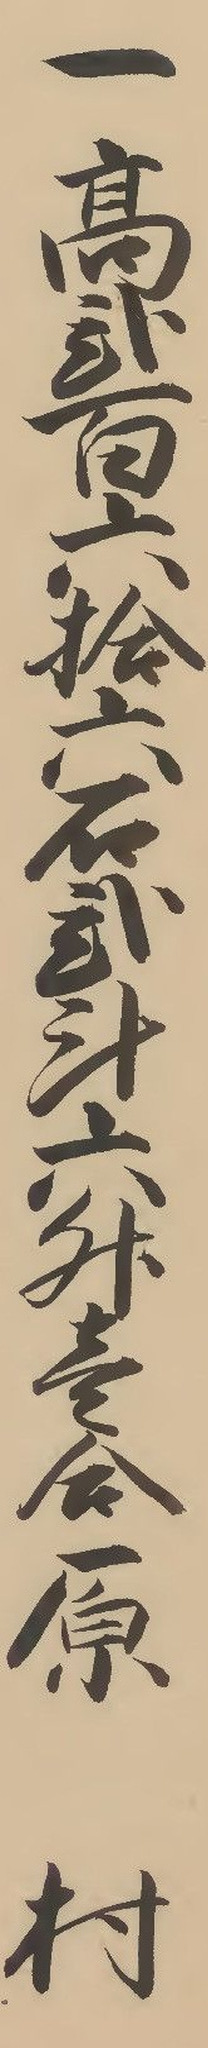一高弐百六拾六石弐斗六升壱合原村
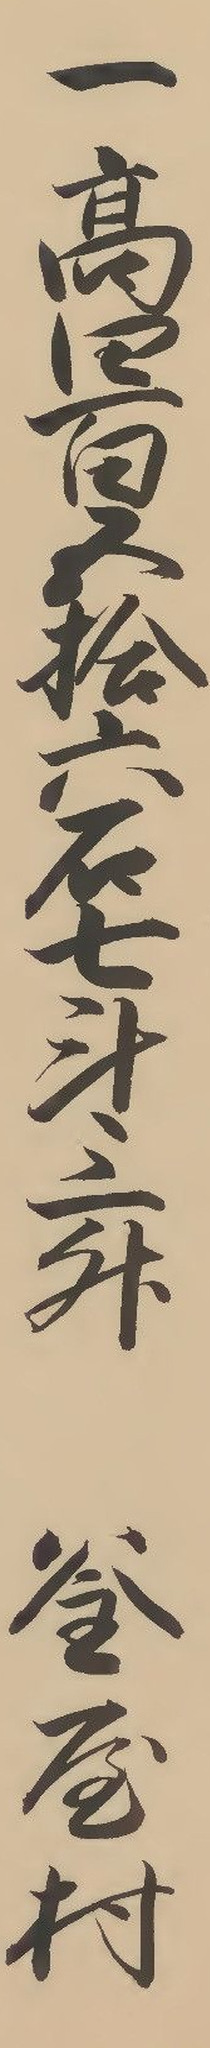一高四百五拾六石七斗三升釜屋村
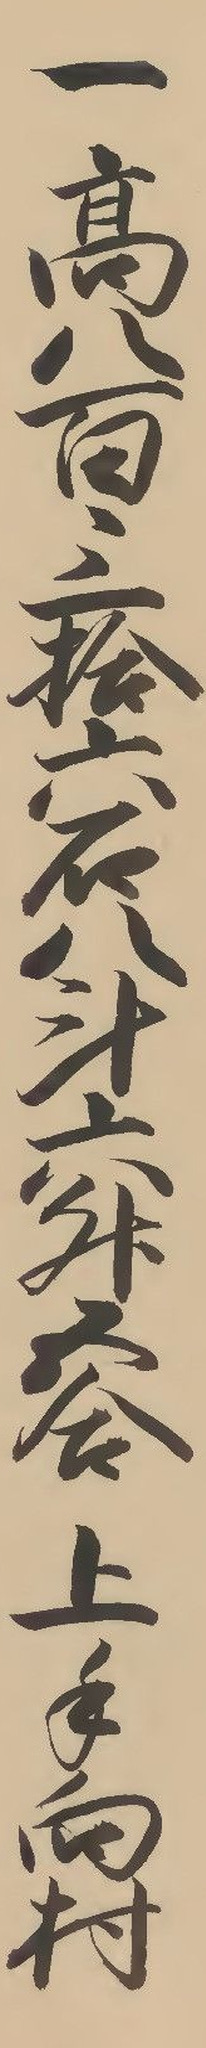一高八百三拾六石八斗六升五合上手向村
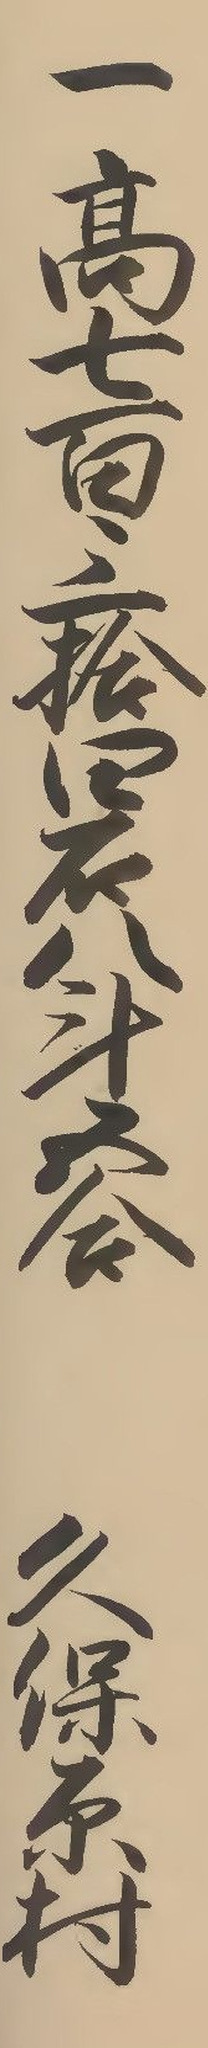一高七百三拾四石八斗五合久保原村
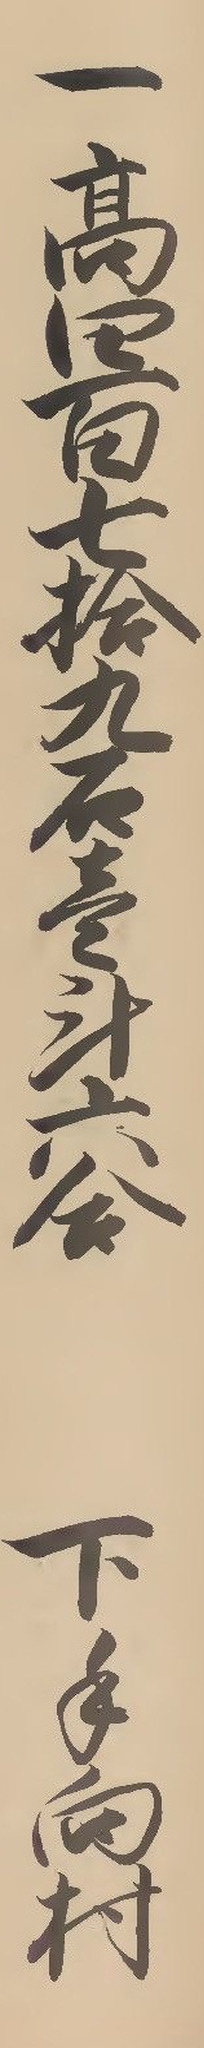一高四百七拾九石壱斗六合下手向村
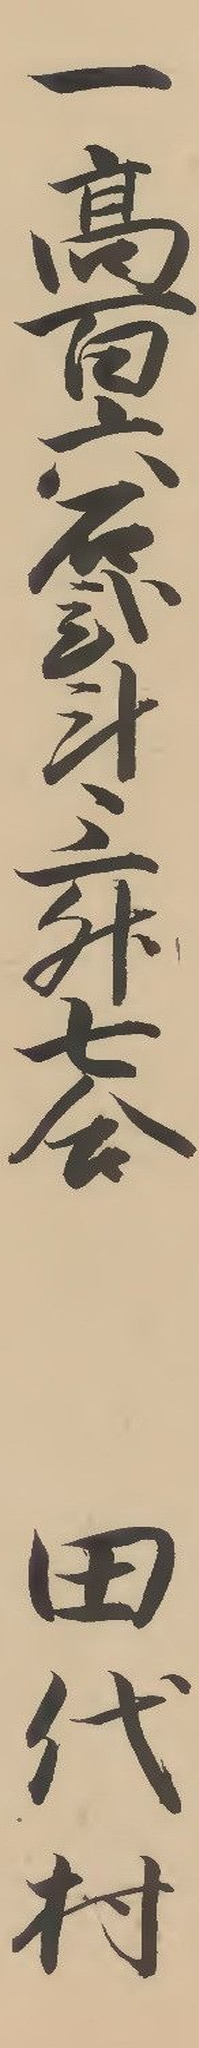一高百六石弐斗三升七合田代村
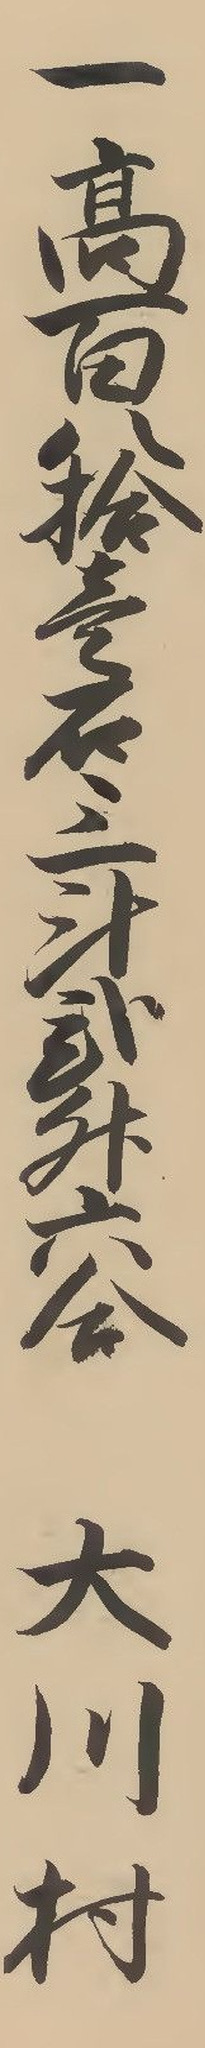一高百八拾壱石三斗弐升六合大川村
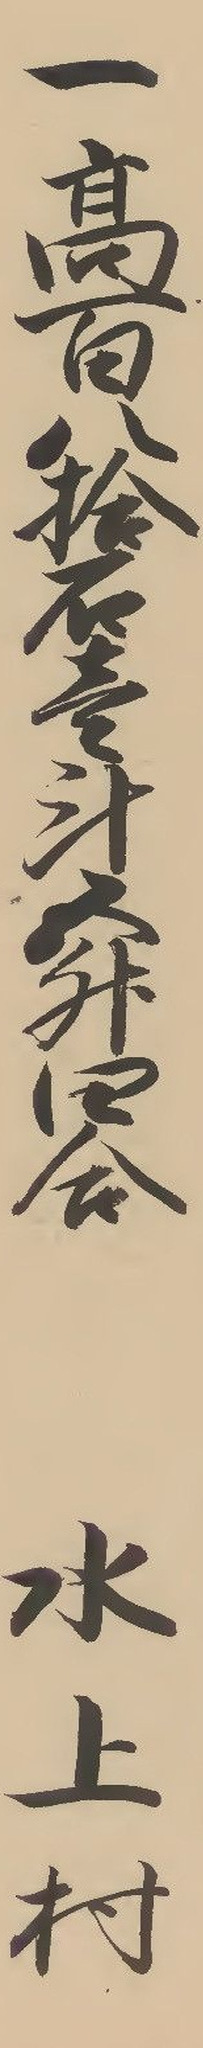一高百八拾石壱斗五升四合水上村

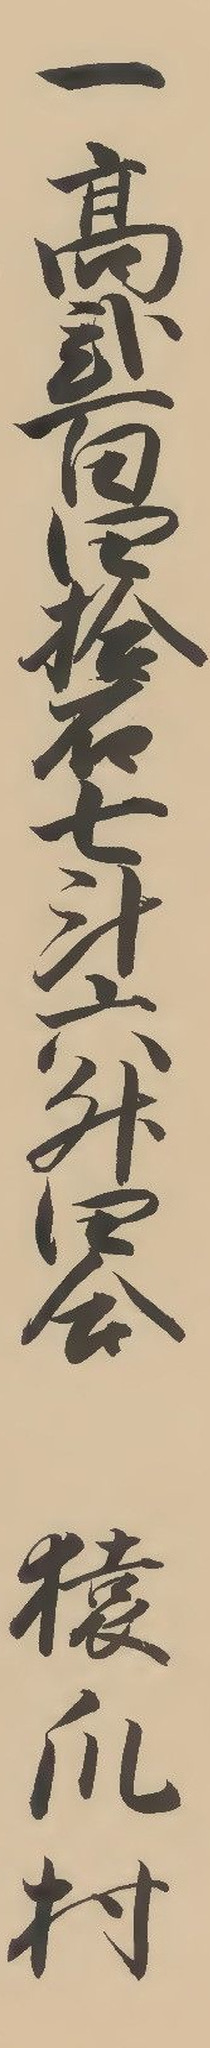一高弐百四拾石七斗六升四合猿爪村
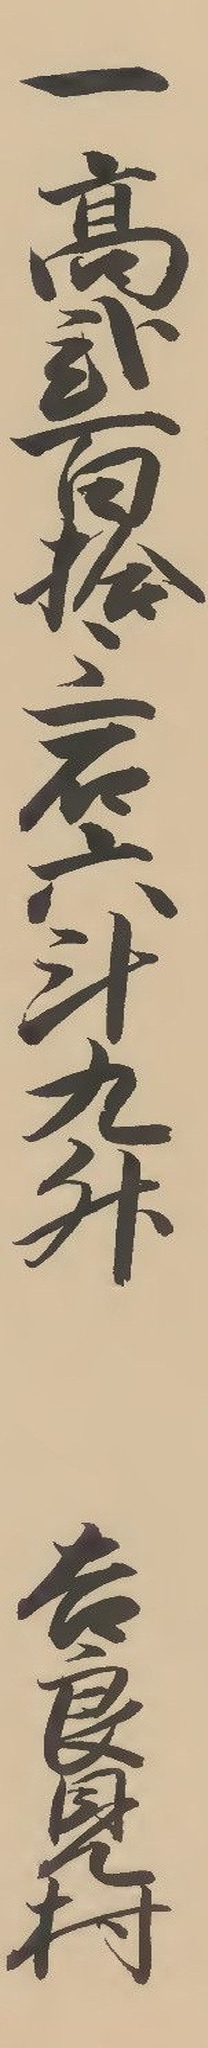一高弐百拾三石六斗九升吉良見村
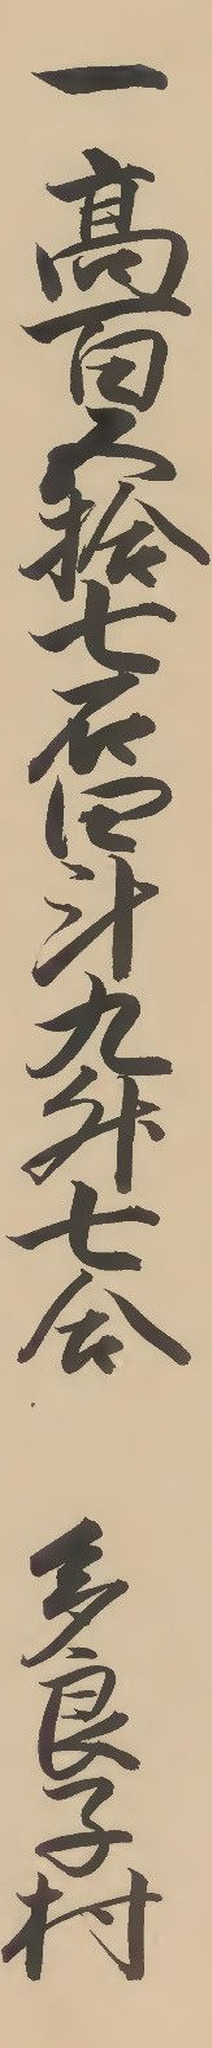一高百五拾七石四斗九升七合多良子村
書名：美濃国郷帳
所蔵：国立公文書館 National Archives of Japan
